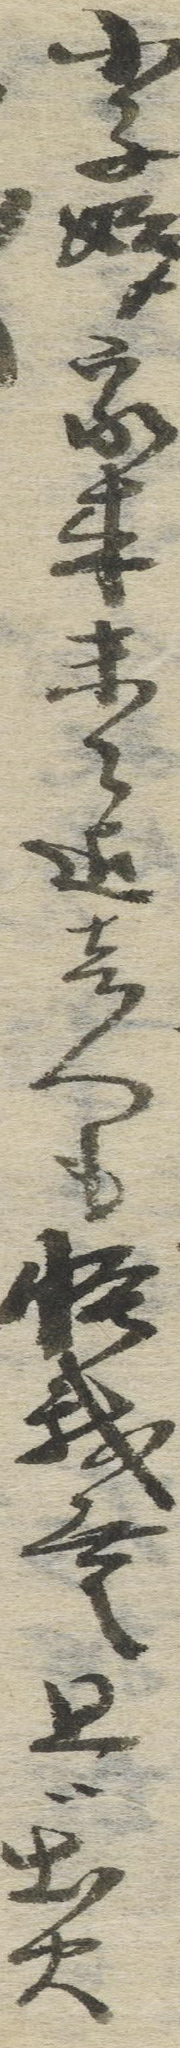小子始家来未々迄壱人も怪我無之且ハ出火
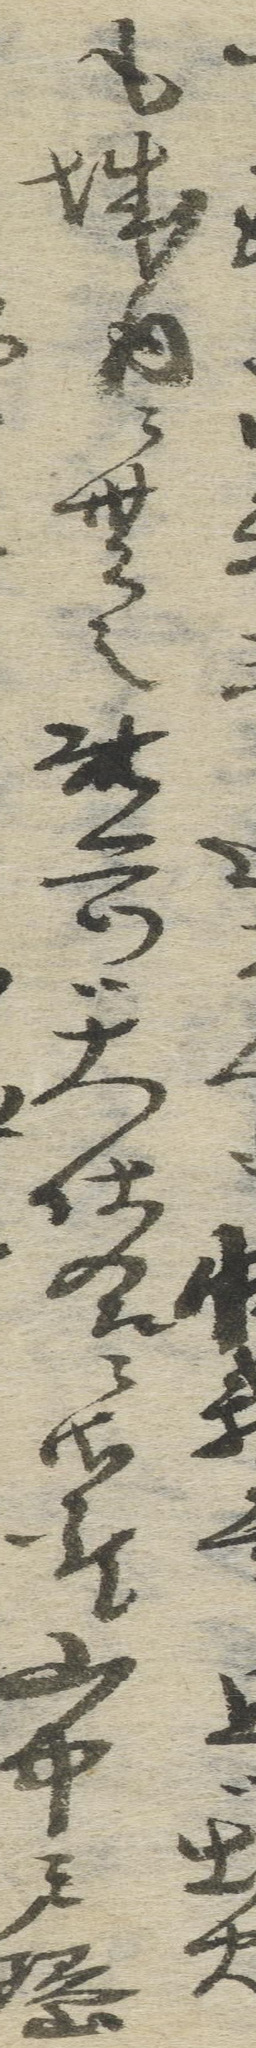も城内二無之此二ツハ大仕合二御座候山中戸隠山
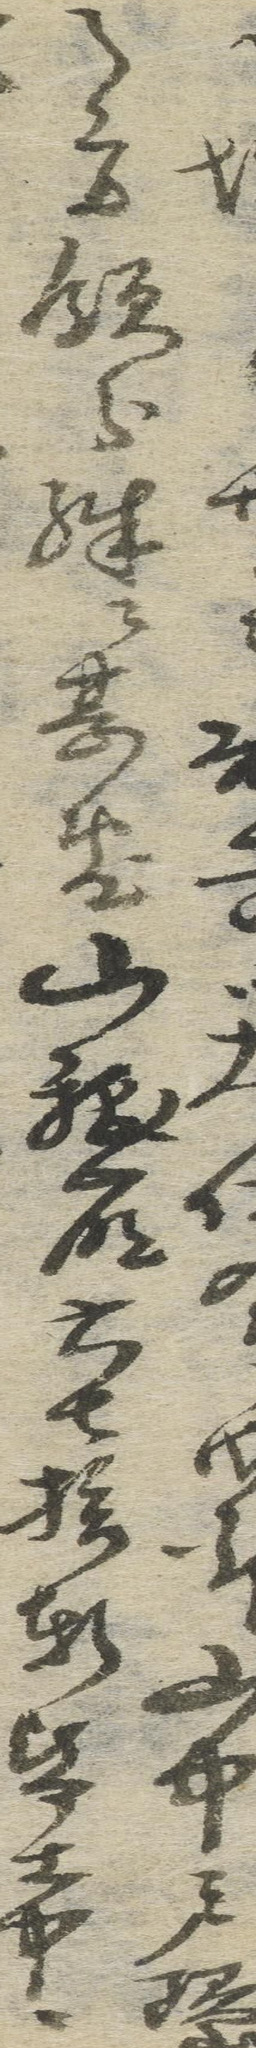之方領分殊二甚敷山抜崩右は拾軒皆土中二
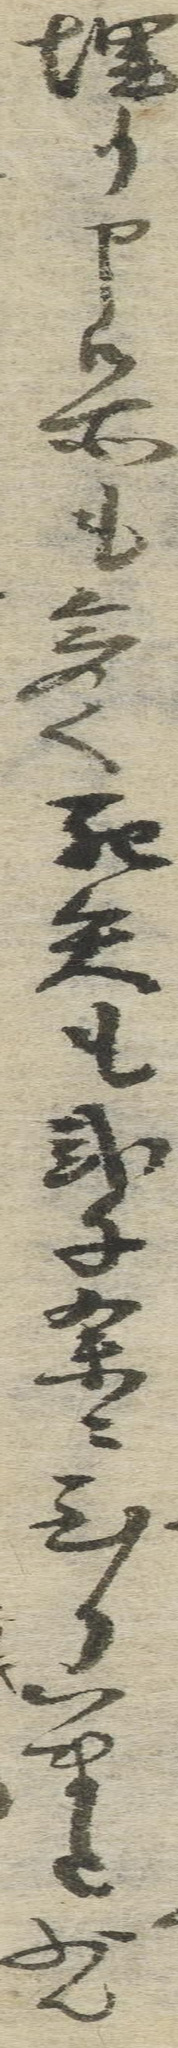埋り申候所も多く死失も弐千余二至りいまた少々

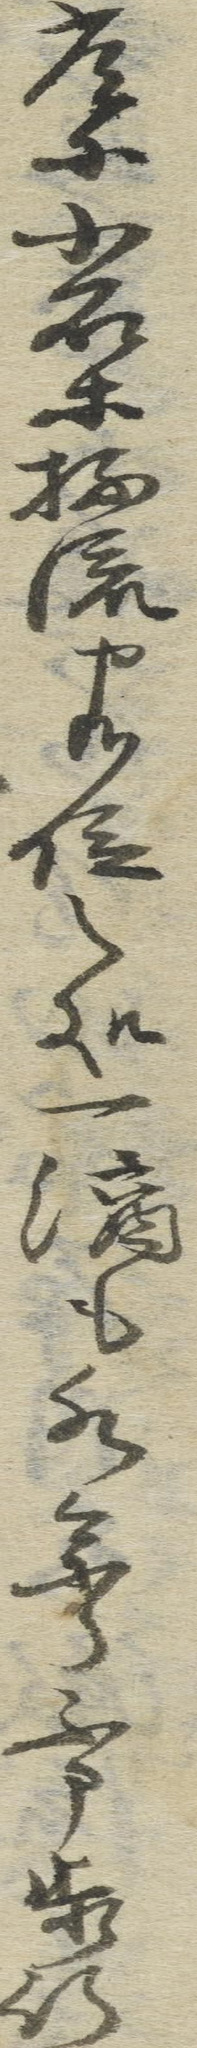常に小石等抔流申候位之処一滴も水参り不申歩行
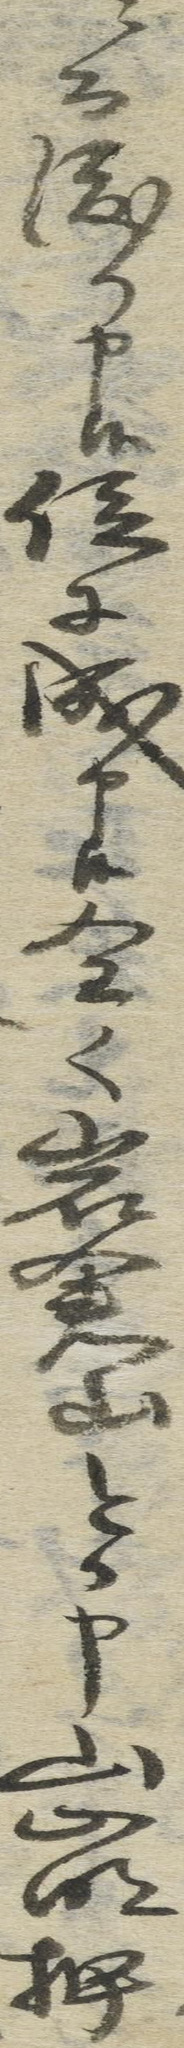二而渡り申候位に成申候全く岩倉山と申山崩押
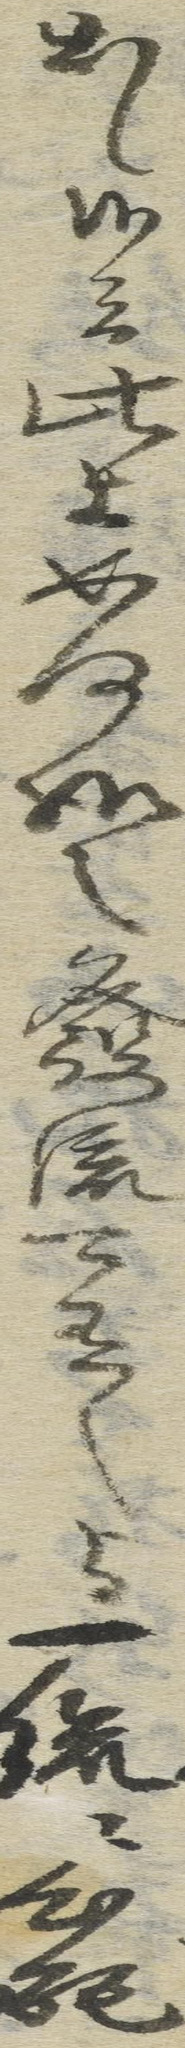出し候二而此上如何様之発流可有と一統二心配
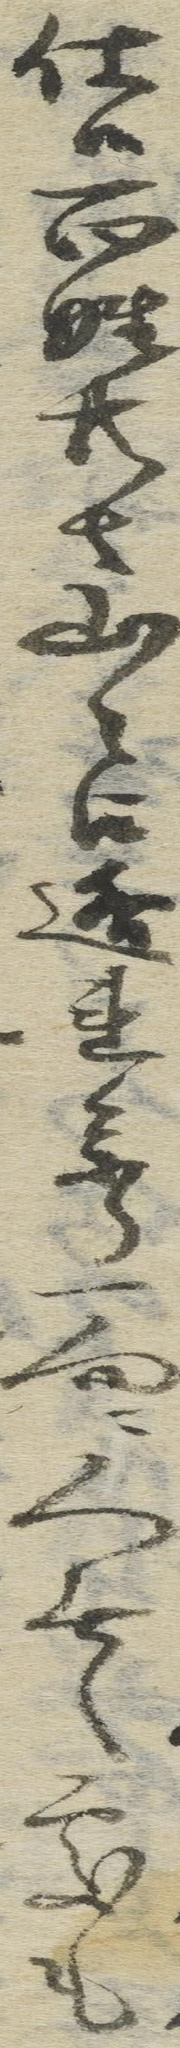仕候百姓共は山々江遁れ参り一向二人無之処も
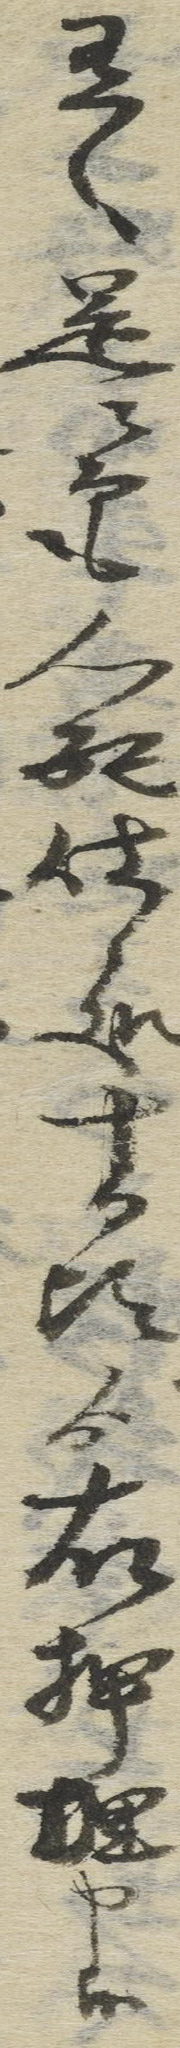有之是二而も心配仕候処十日頃ゟ右押埋申候
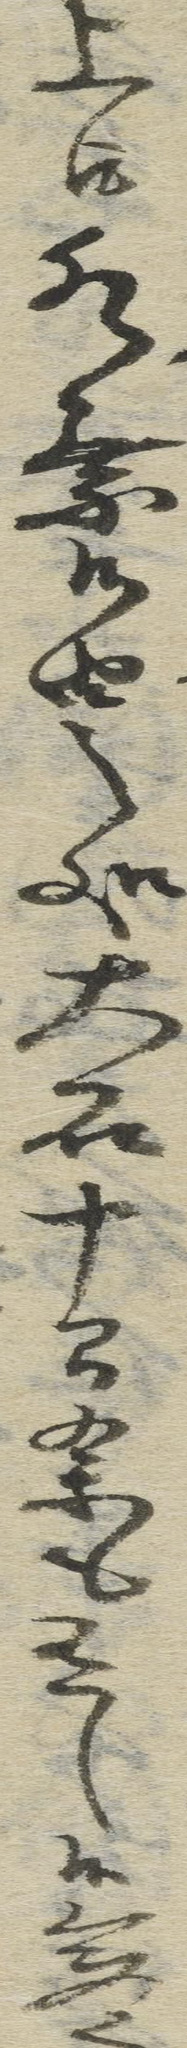上江水乗候由之処大石十間余も有之候多く
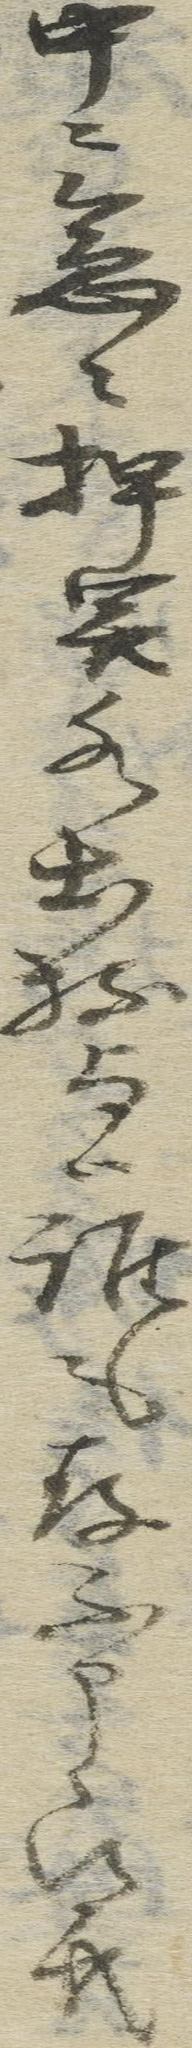中二急二押開水出抔とハ誰も存不申候得共
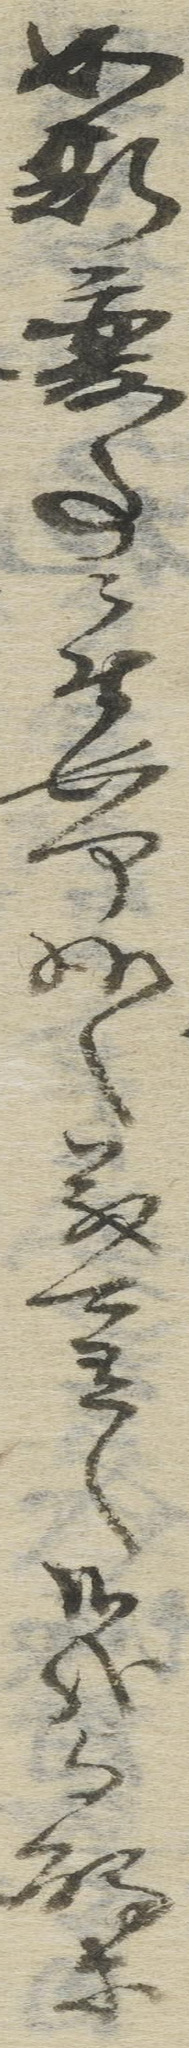如斯変事二付如何様之義可有之候哉と水等
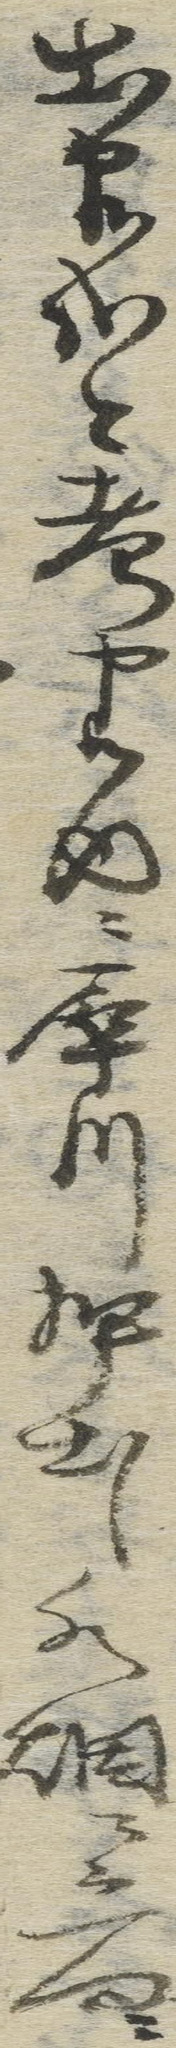出申候哉と考申候内二犀川押出シ水烟二而一面二
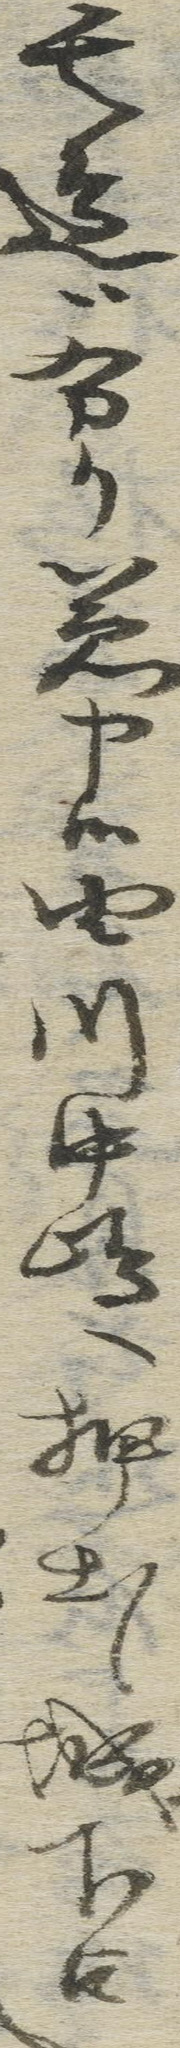其辺ハ分り兼申候由川中嶋へ押出し城下江も
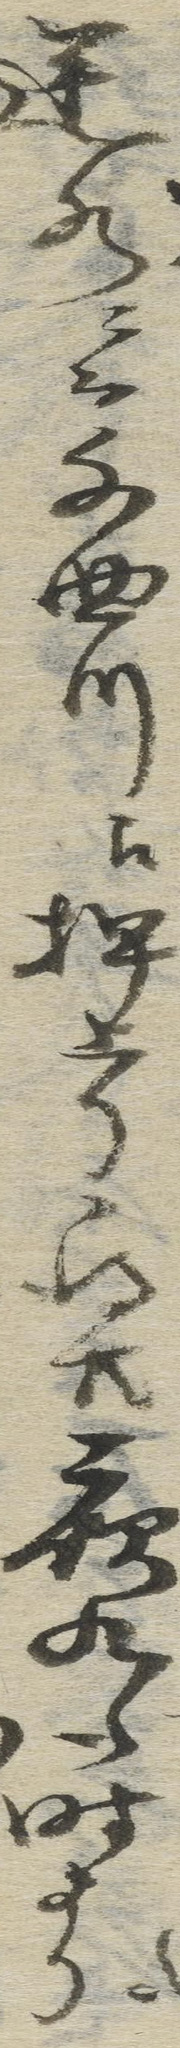逆水二而千曲川江押上り候得共夜九ッ時より
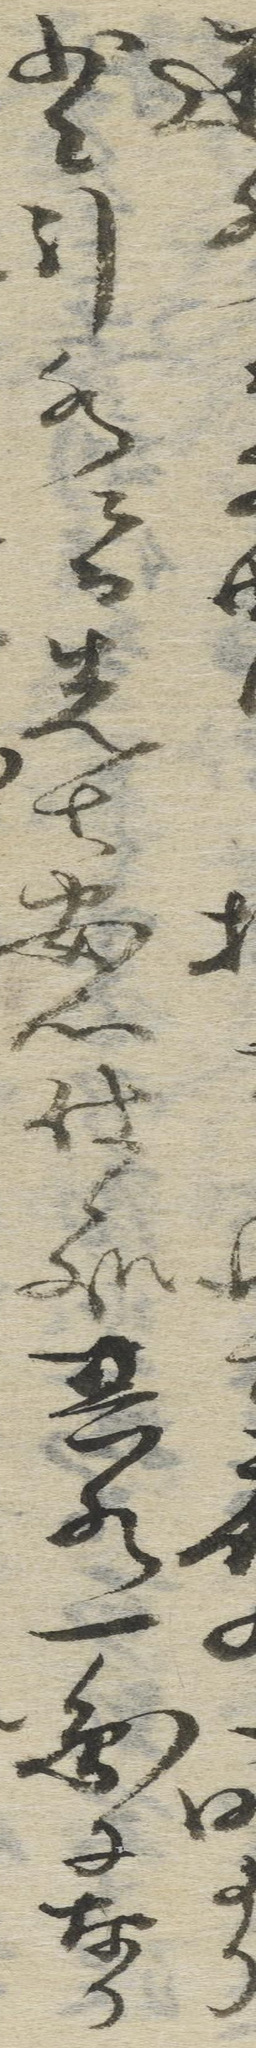少々引水二而先は安心仕候処其水一圓二なり
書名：信濃越後　地震書留
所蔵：東京大学地震研究所図書室 Earthquake Research Institute Library, The University of Tokyo, JAPAN
